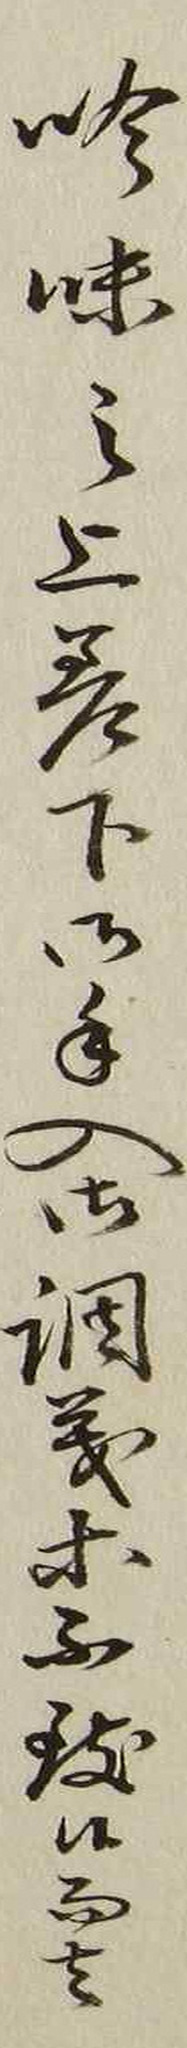吟味之上差下御手入御調義等不致候而は
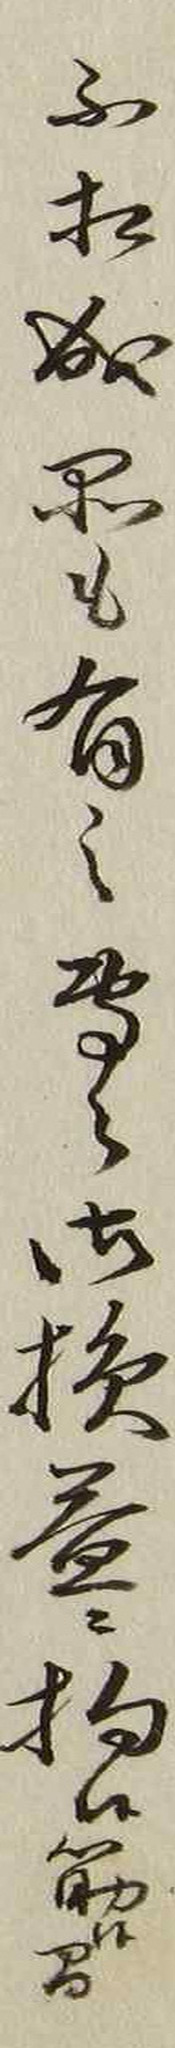不相成品も有之専ら御損益ニ拘候筋候間
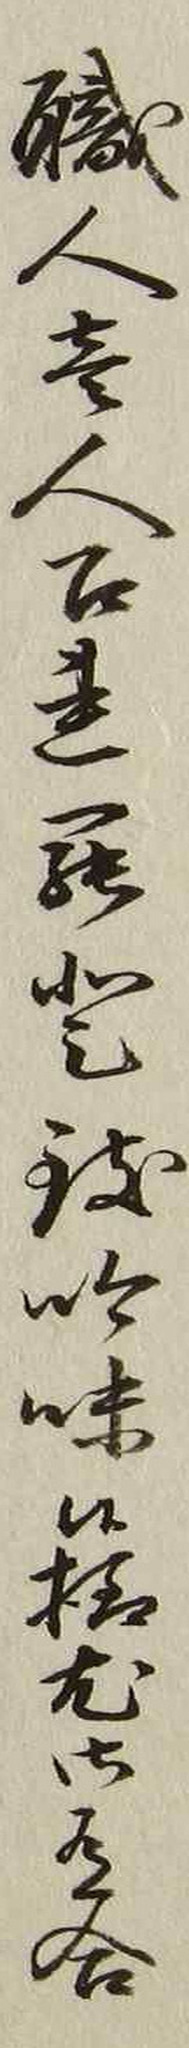職人壱人召連罷登致吟味候様尤御有合
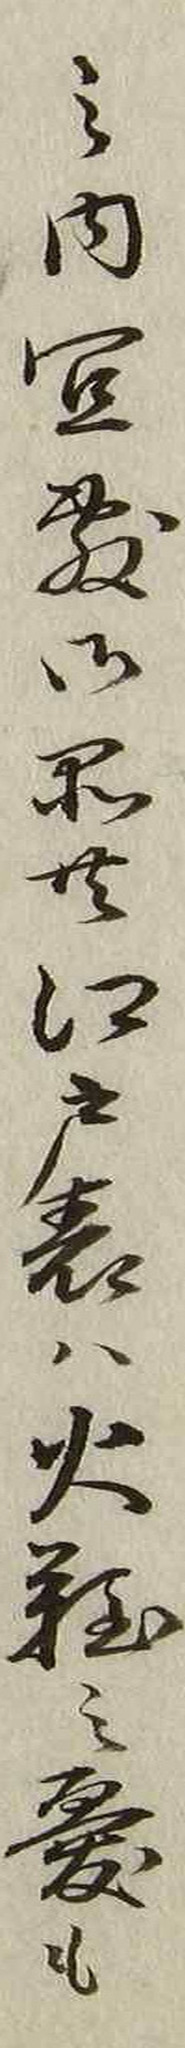之内宜敷御品共江戸表ハ火難之憂も
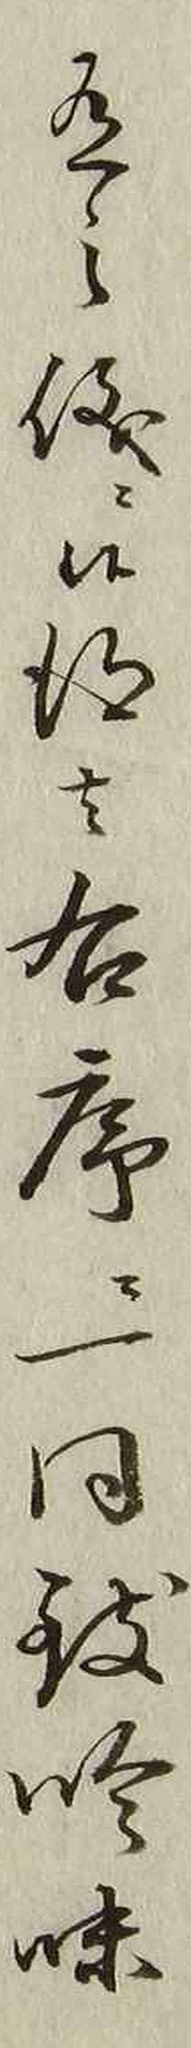有之儀ニ候得は右序ニ一同致吟味
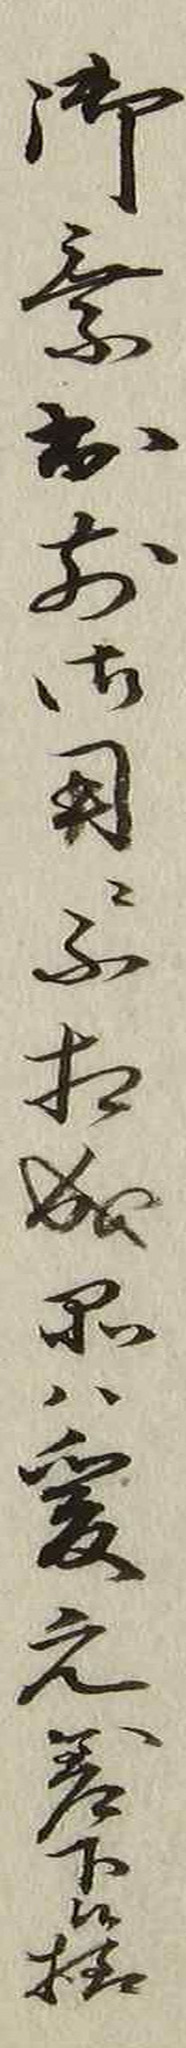御乗出前御用ニ不相成品ハ爰元へ差下候様
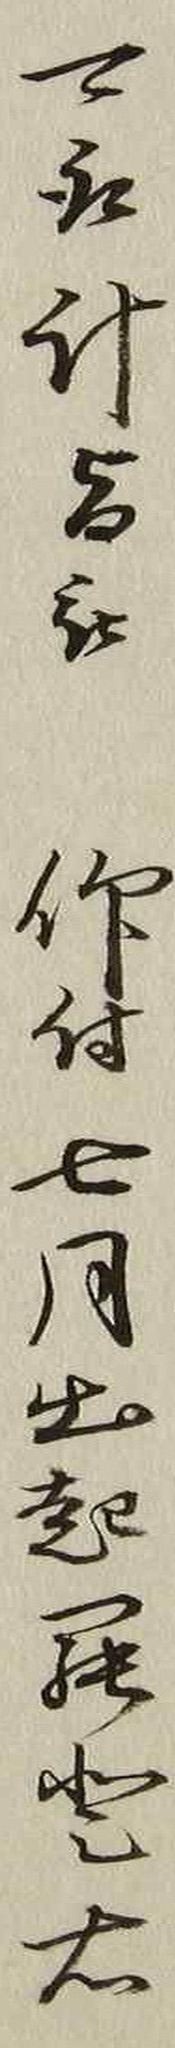可取計旨被仰付七月出起罷登右
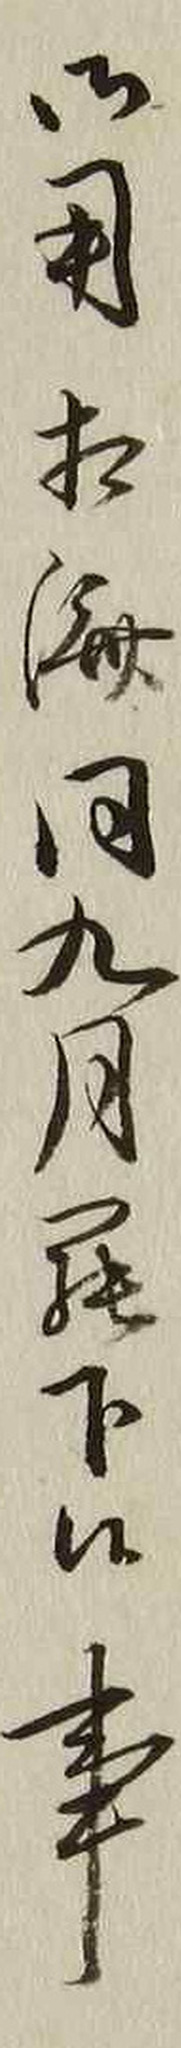御用相済同九月罷下候事
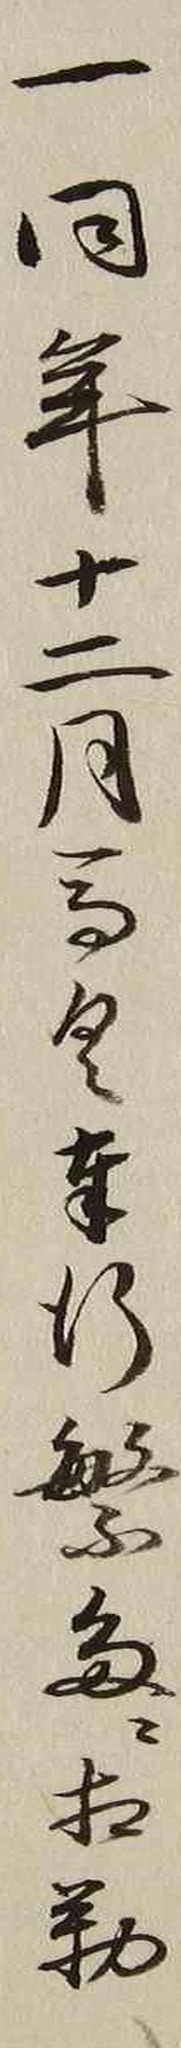一同年十二月馬具奉行繫多ニ相勤
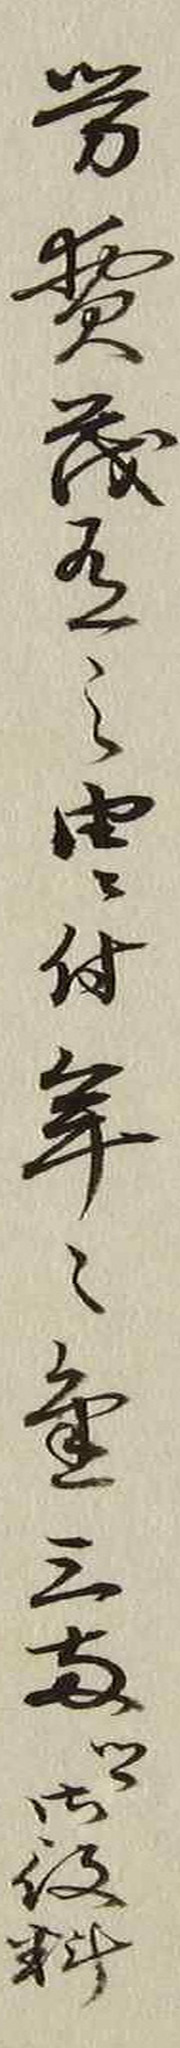労費も有之由ニ付年々金三両ツヽ御役料
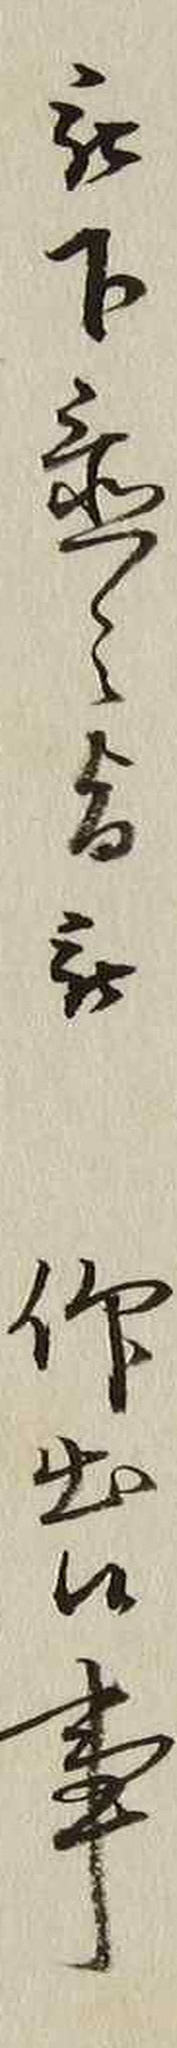被下置之旨被仰出候事
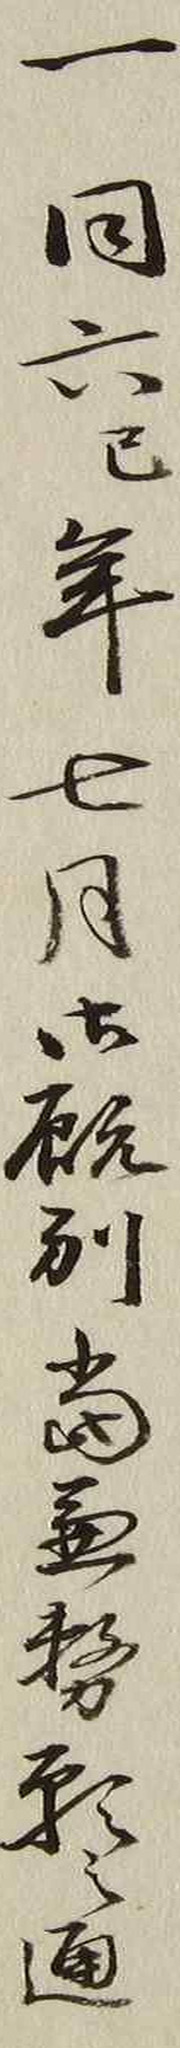一同六巳年七月御厩別当兼務願之通
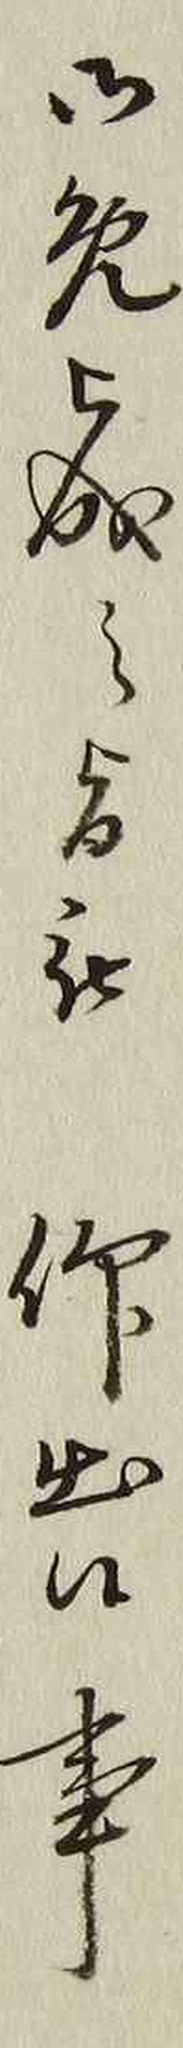御免被成之旨被仰出候事
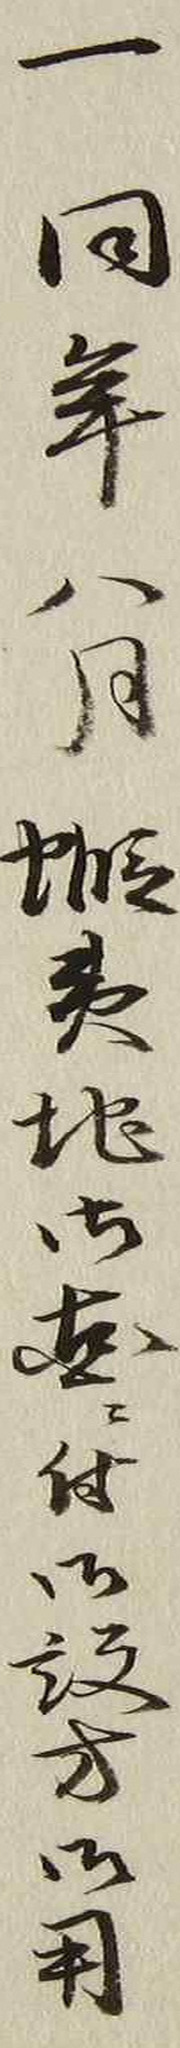一同年八月蝦夷地御固ニ付御説方御用
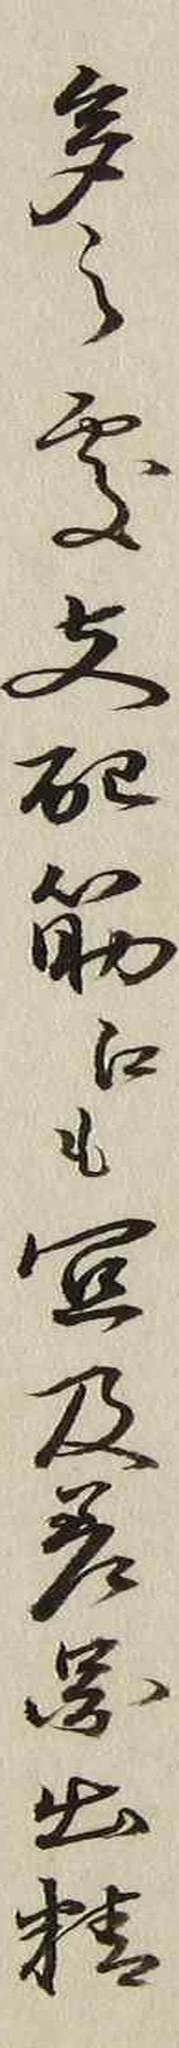多之処支配筋えも宜及差図出精
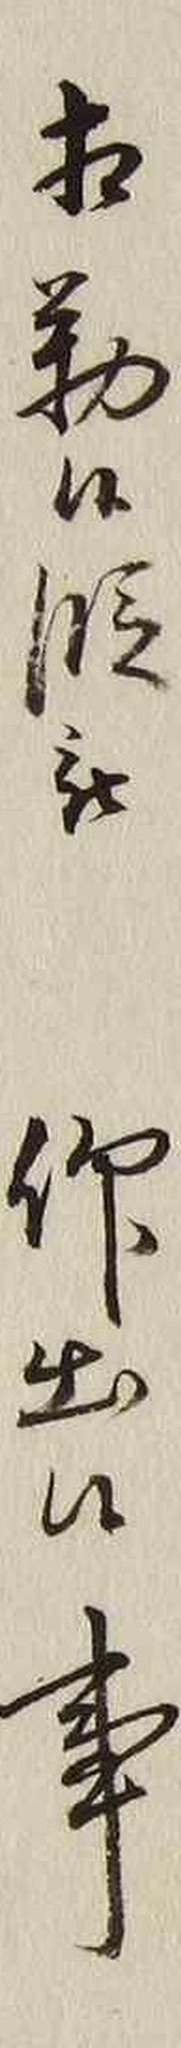相勤候段被仰出候事
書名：諸士系譜　巻之160　な之部2
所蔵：会津若松市立会津図書館
